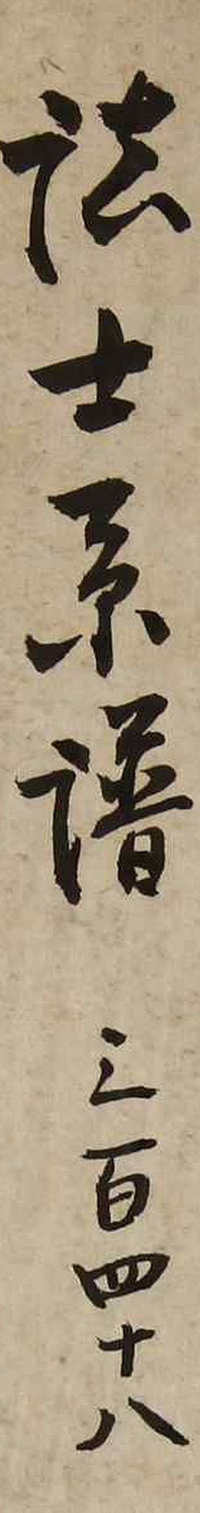諸士系譜三百四十八

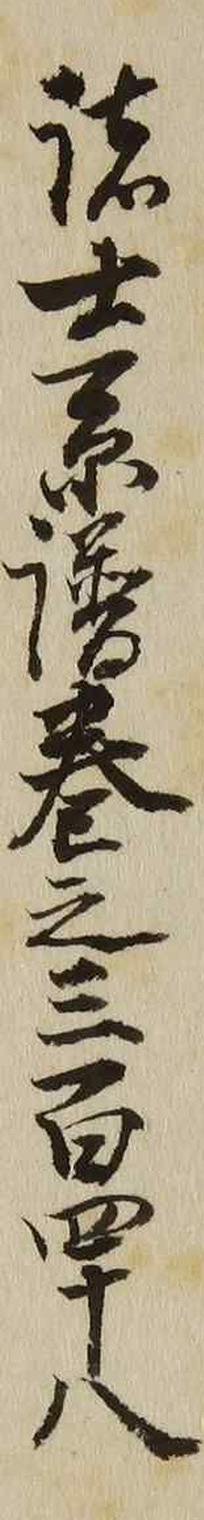諸士系譜巻之三百四十八
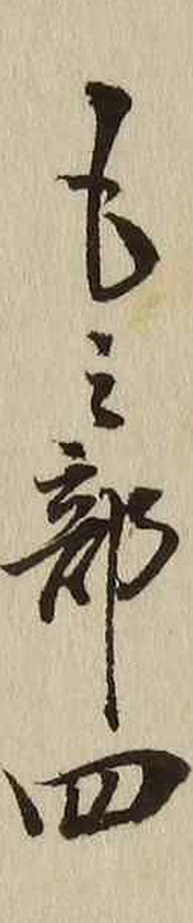も之部四
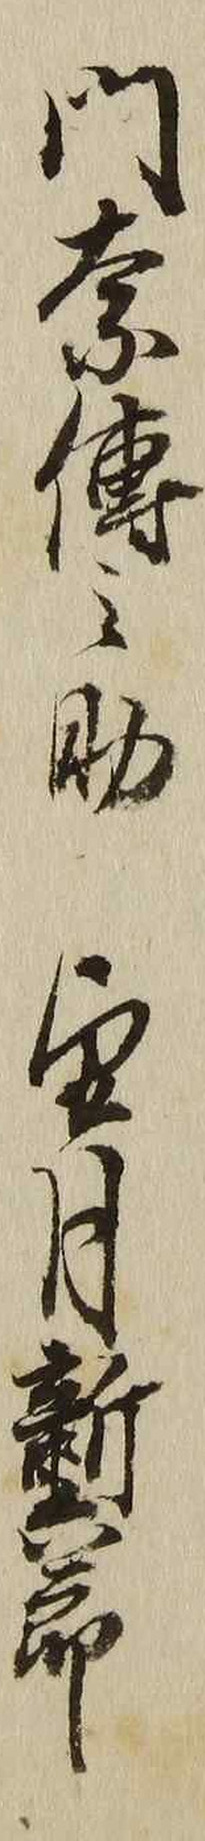門奈伝之助望月新六郎

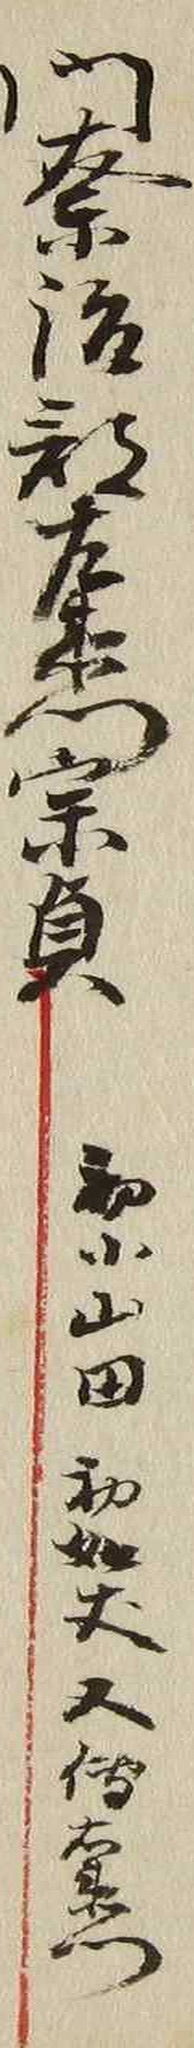門奈治部左衛門宗貞初小山田初如丈又伝右衛門
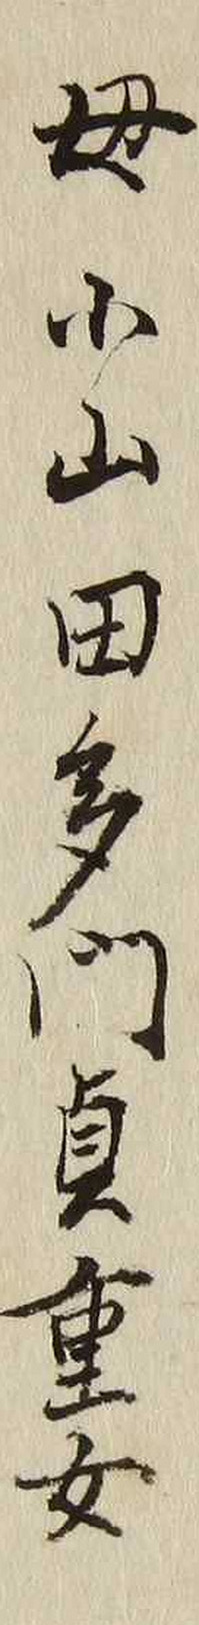毋小山田多門貞重女
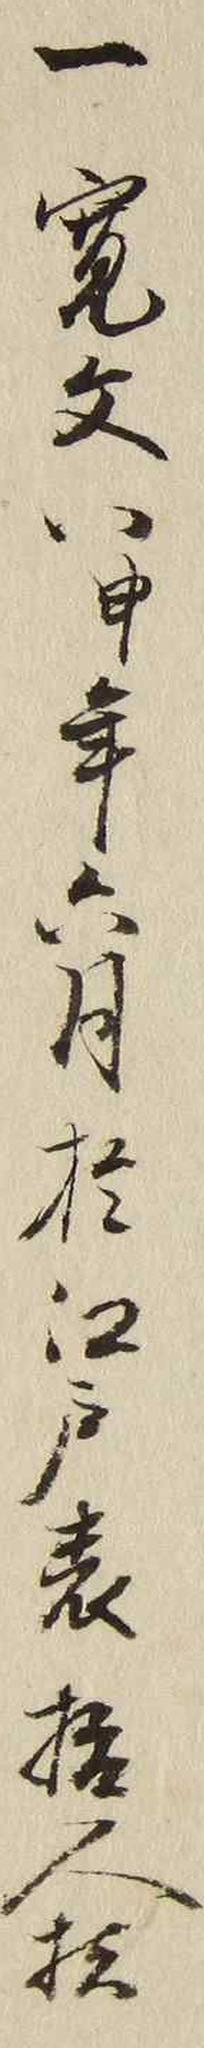一寛文八申年六月於江戸表拾人扶

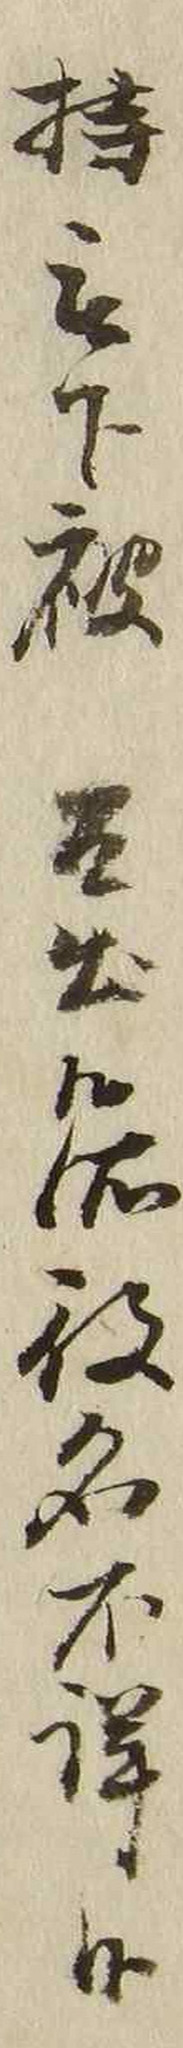持被下被召出候所役名不詳候
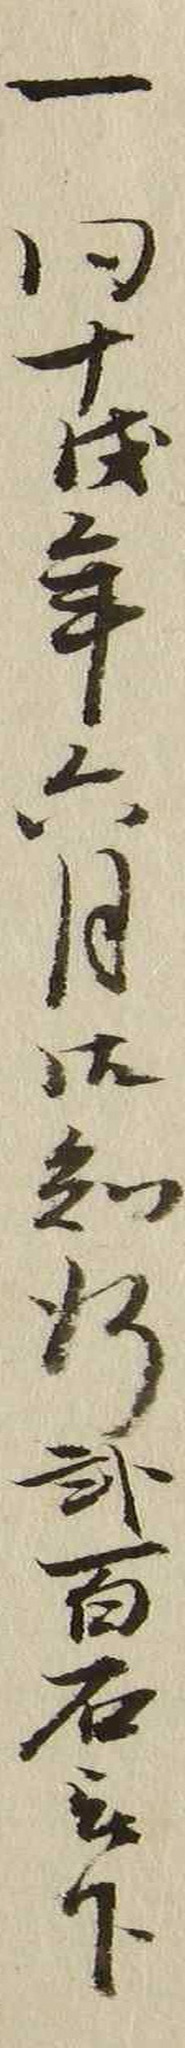一同十戊年六月御知行弐百石被下
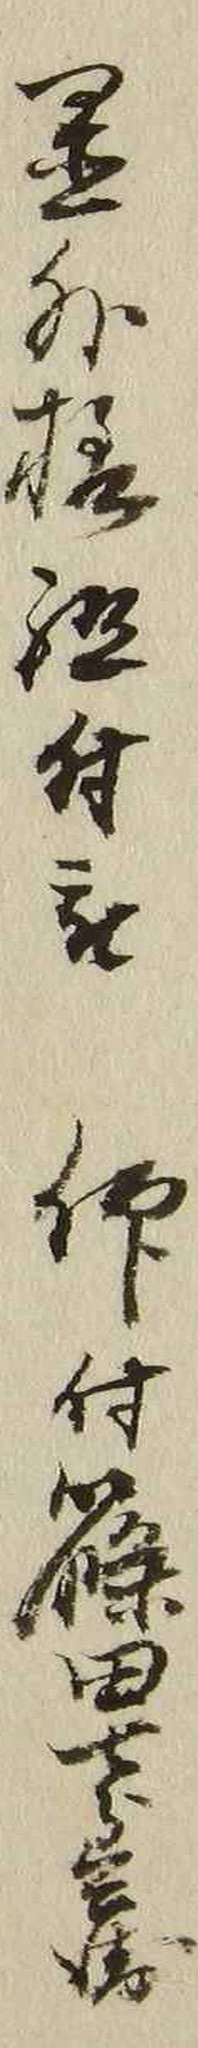置外様組付被仰付篠田七郎兵衛
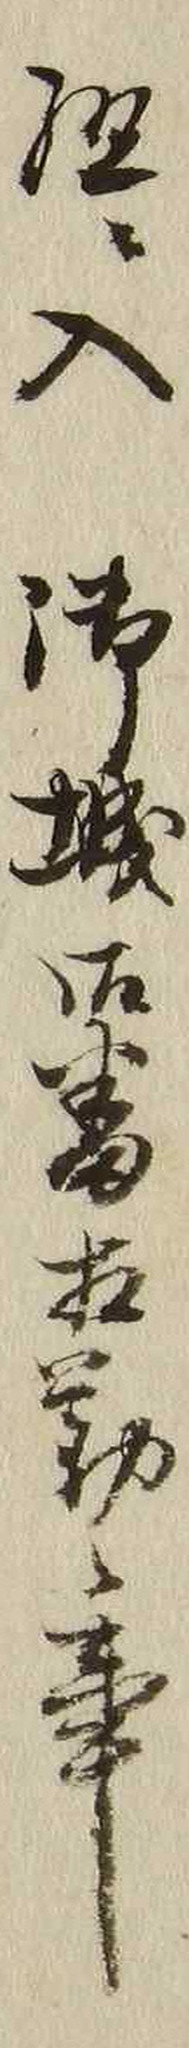組ニ入御城御番相勤候事
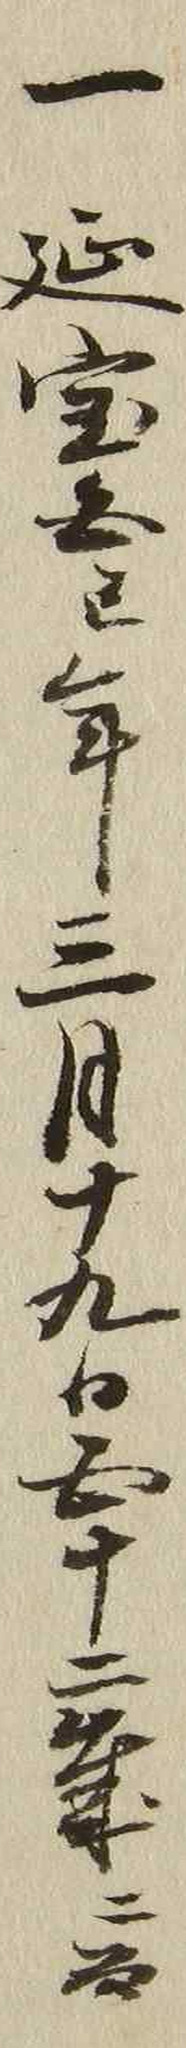一延宝五巳年三月十九日五十二歳ニ而
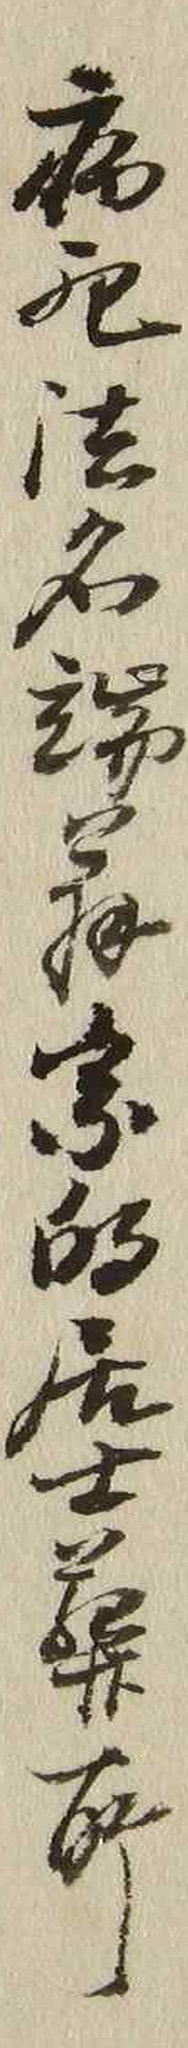病死法名端翁宗的居士葬所
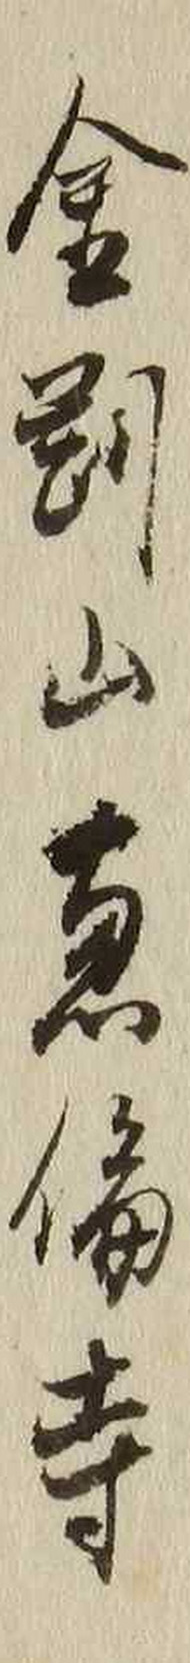金剛山恵倫寺
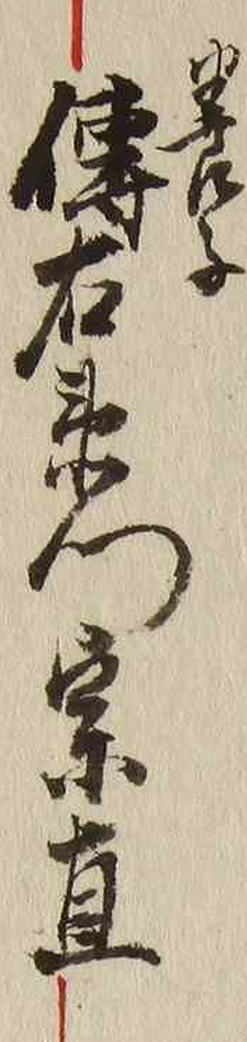伝右衛門宗直
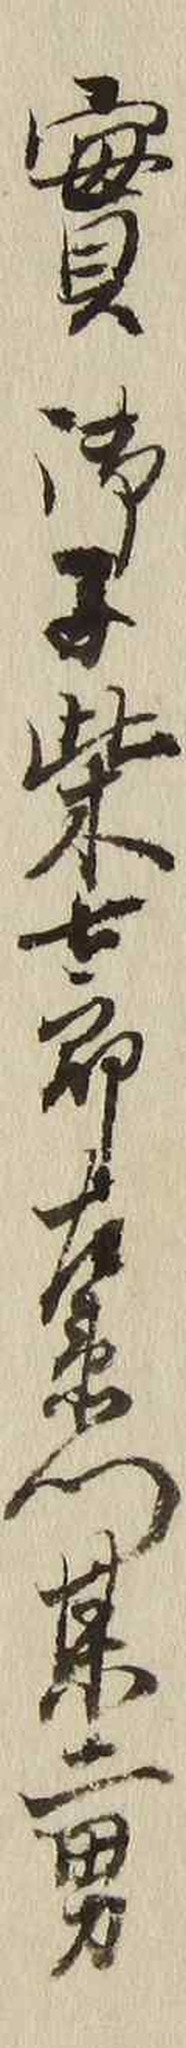実御子柴七郎左衛門某二男
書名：諸士系譜　巻之348　も之部4
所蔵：会津若松市立会津図書館
